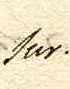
Iur.
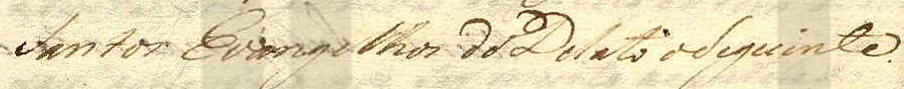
Santos Evangelhos do Delato o Seguinte.
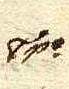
Tx.o
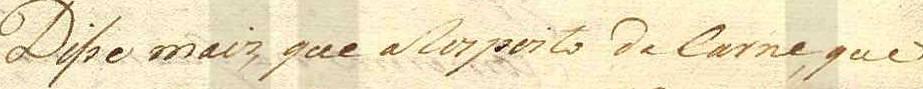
Disse mais, que a Respeito da Carne, que
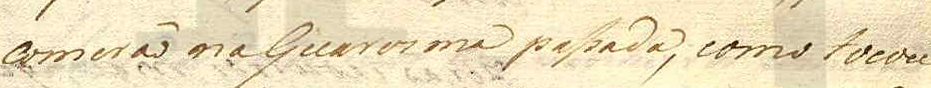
comeraõ na Quaresma passada, como tocou
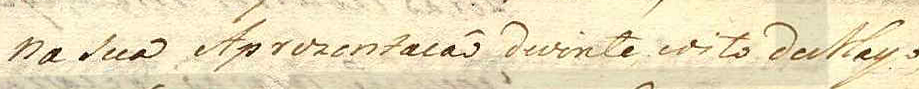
na sua Aprezentacaõ de vinte e oito de Mayo,
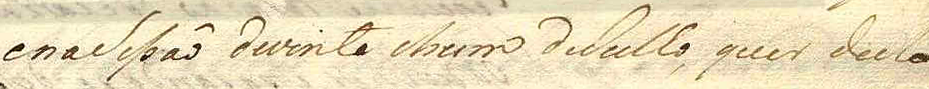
e na Sessaõ de vinte e hum de Iulho, quer decla
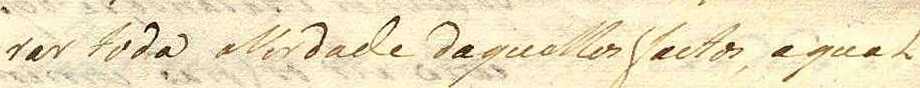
rar toda a Verdade daquelles factos, o quaL
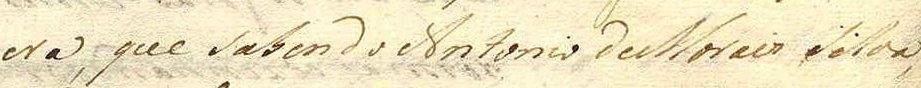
era, que sabendo Antonio de Morais Silva,
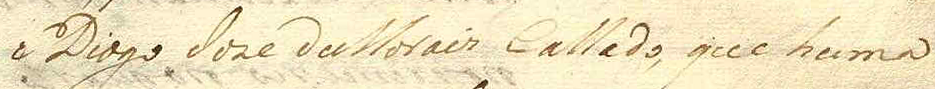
e Diogo Ioze Morais Callado, que huma
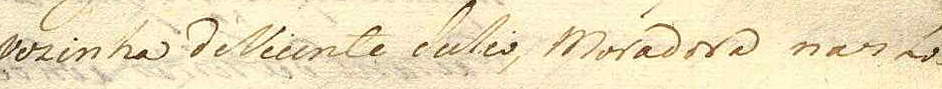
vizinha de Vicente Iulio, Moradora nas Lo
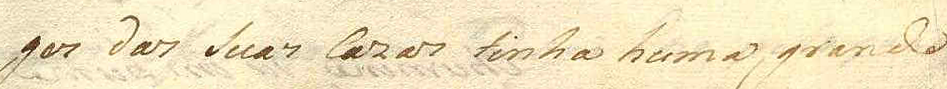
ges das suas cazas tinha huma grande
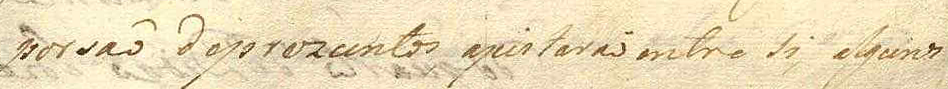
porsaõ de prezuntos ajustaraõ entre si alguns
